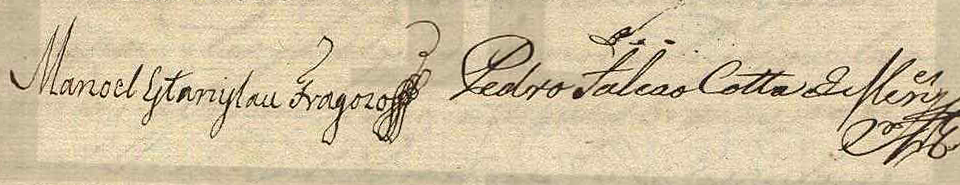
Manoel Estanilau Fragozo Pedro Falcao Cotta de Menz.es
